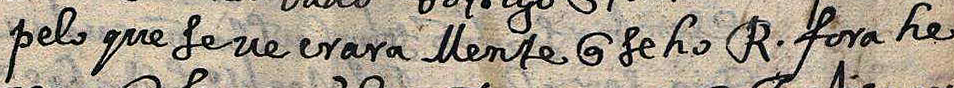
pelo que se ue craraMente q̄ se ho R. fora he
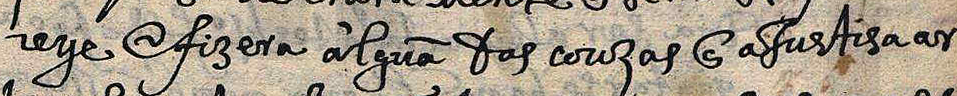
rege e fizera alguā Das couzas q̄ a Justisa ar
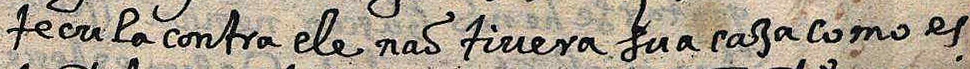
tecula contra ele naõ tiuera sua caza como es
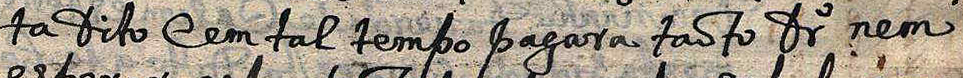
ta Dito e em tal tempo pagara taõto Dro nem
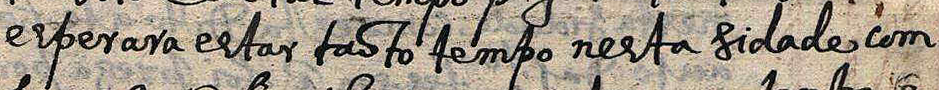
esperara estar taõto tempo nesta sidade com
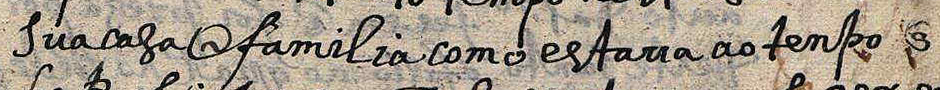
sua casa e familia como estaua ao tenpo q̄
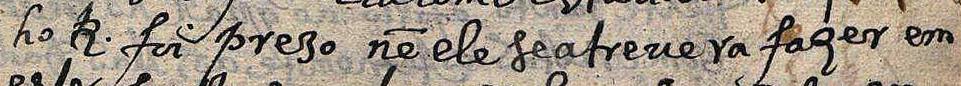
ho R. foi prezo nē ele se atreuera fazer em
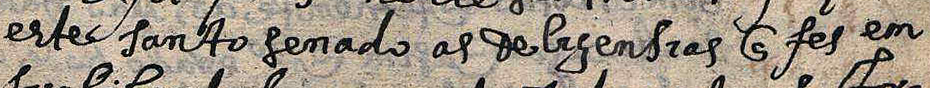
este santo senado as deligensias q̄ fes em
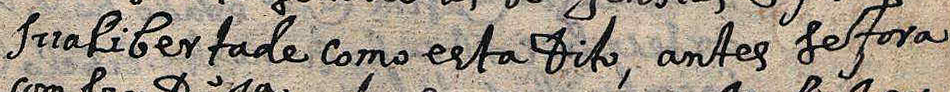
sua libertade como esta Dito, antes se fora
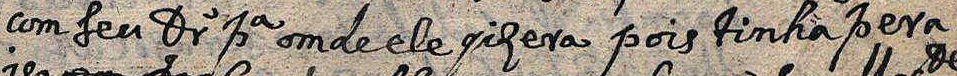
com seu Dro pa omde ele qizera pois tinha pera
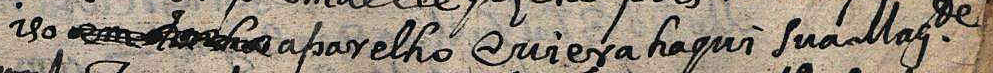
lho em taoho aparelho e uiera haqui sua Mag.de
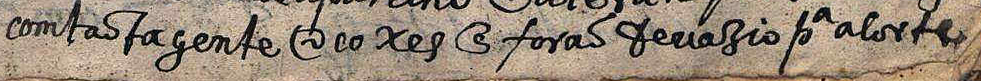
com taõta gente E coxes q̄ foraõ De uazio pa a cortes
